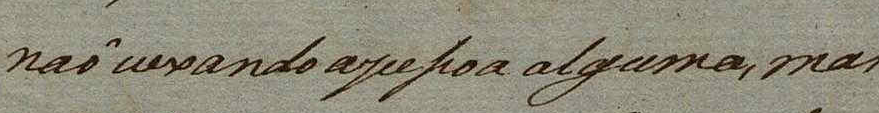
naõ uexando a pessoa alguma, mas
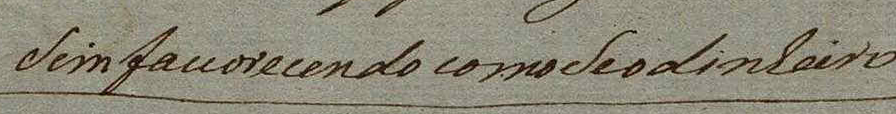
sim fauorecendo com o seo dinheiro
